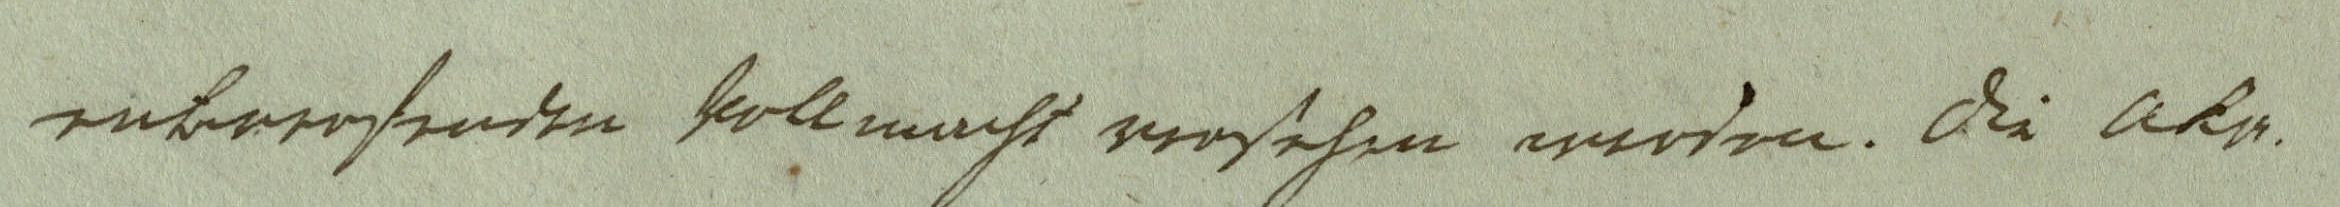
entwerfenden Vollmacht versehen werden. Die Aka¬
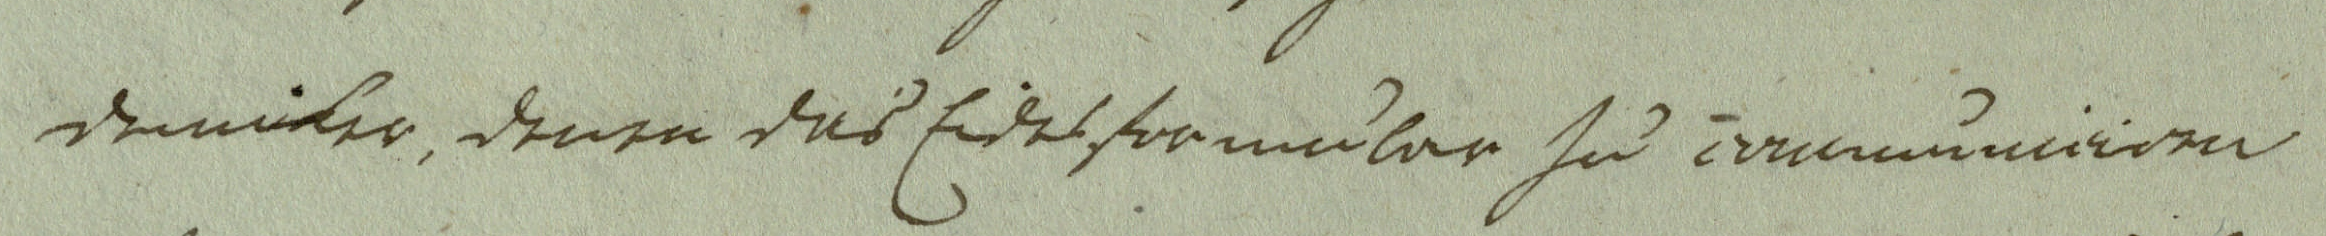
demiker, denen das Eidesformular zu communiciren
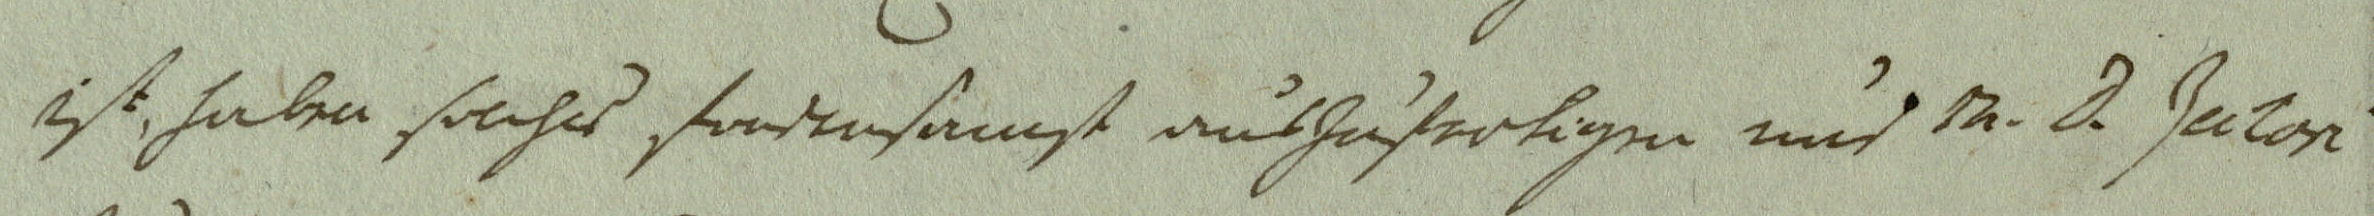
ist, haben solches sondersamst auszufertigen und M. D. Rectori
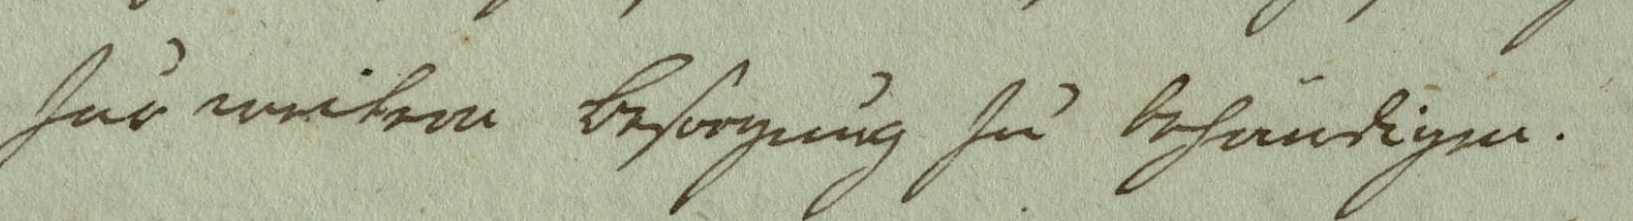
zur weiteren Besorgung zu behändigen.
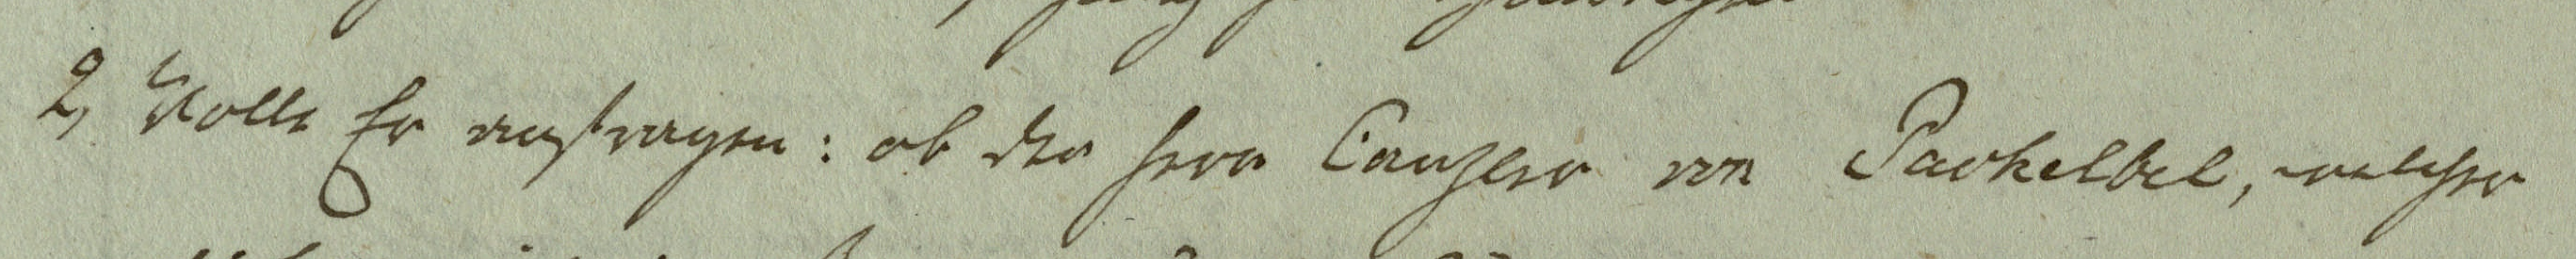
2. Wolle Er anfragen: ob der Herr Canzler von Pachelbel, welcher
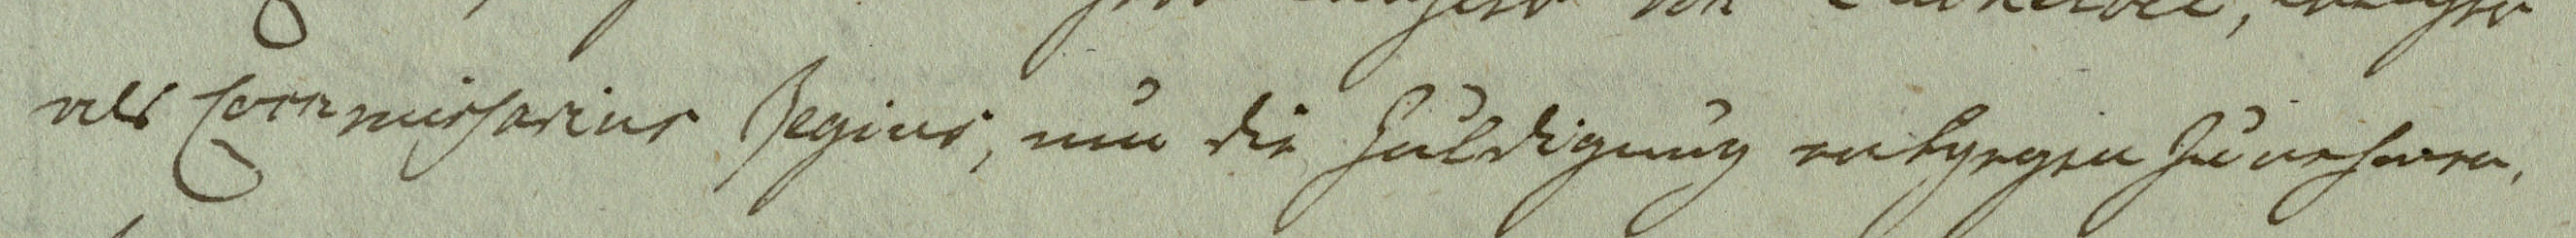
als Commissarius Regius, um die Huldigung entgegen zu nehmen,
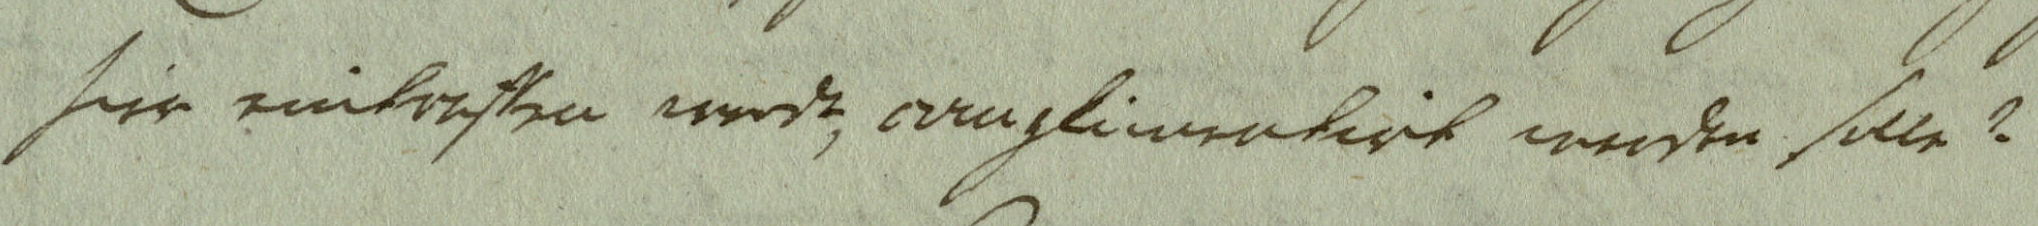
hier eintreffen werde, complimentirt werden solle?
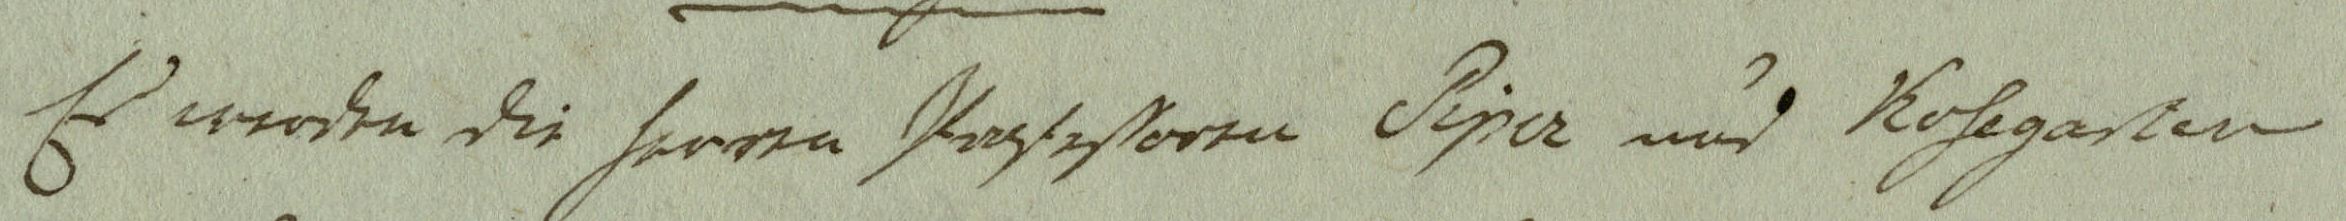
Es werden die Herren Professoren Piper und Kosegarten
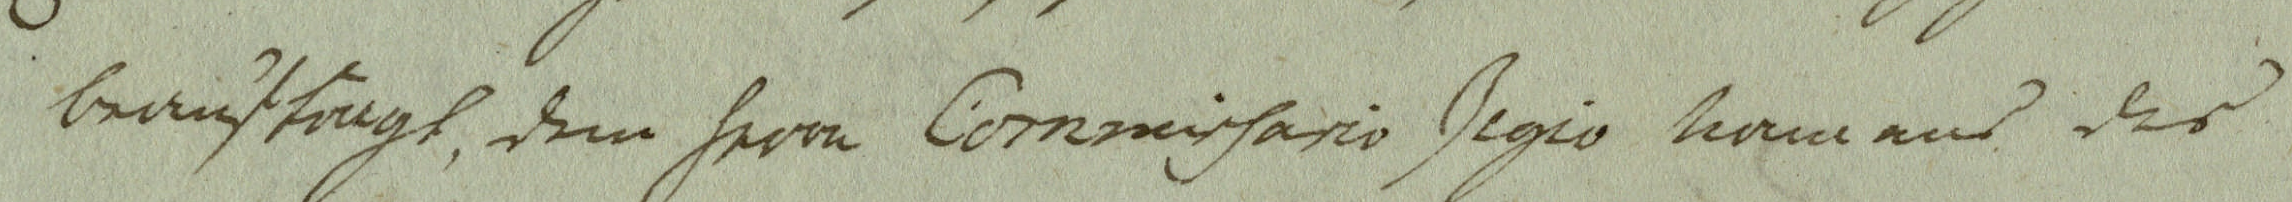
beauftragt, dem Herrn Commissario Regio Namens des
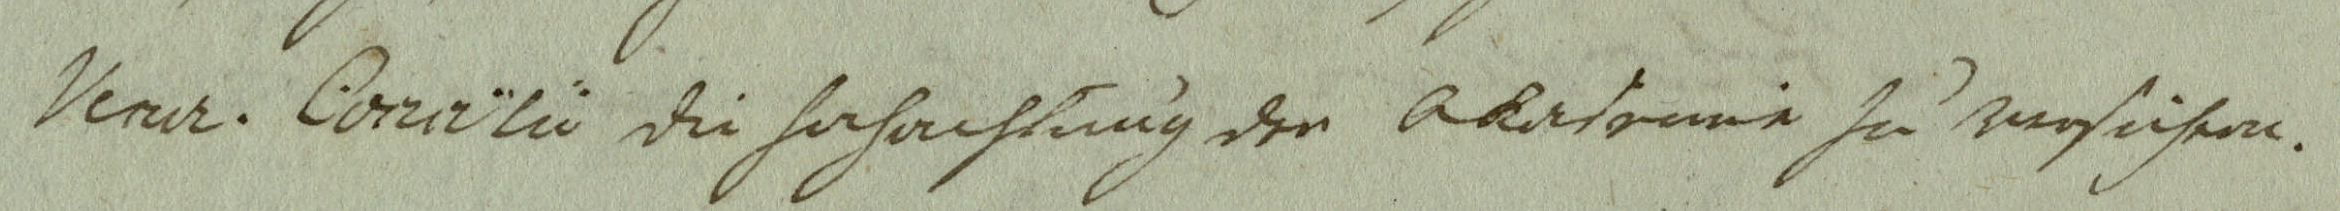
Vener. Concilii die Hochachtung der Akademie zu versichern.
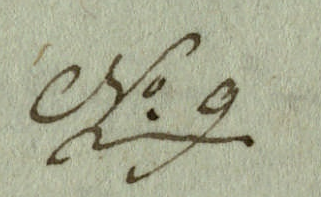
Nº 9.
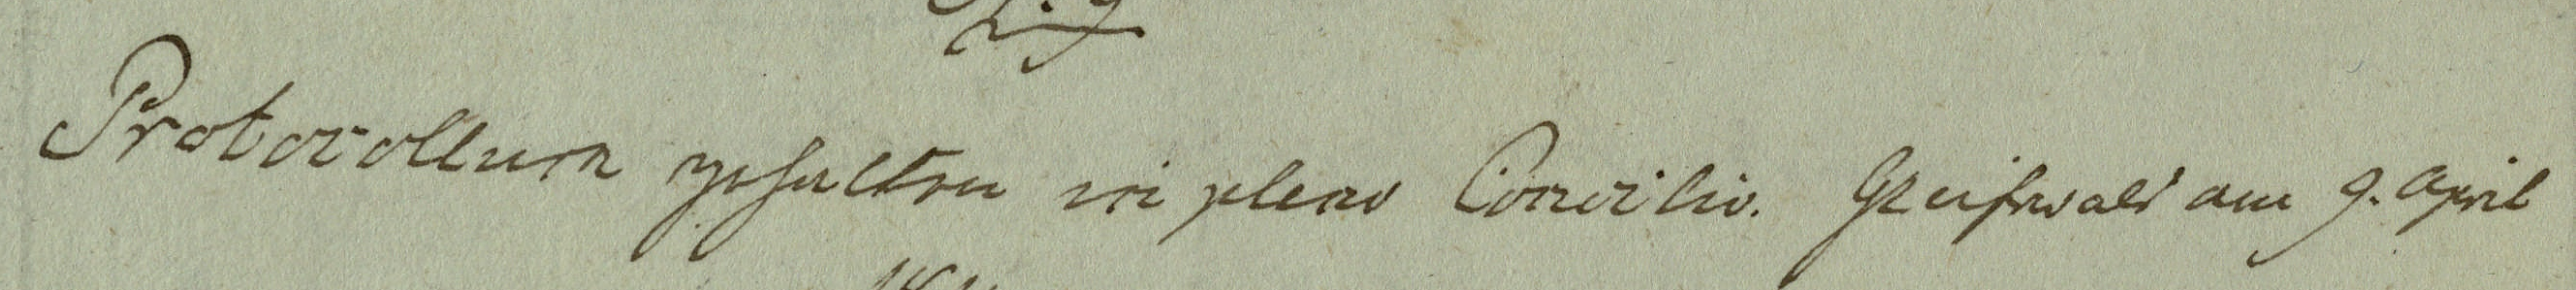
Protocollum gehalten in pleno Concilio. Greifswald am 9. April
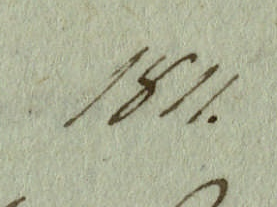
1811.
